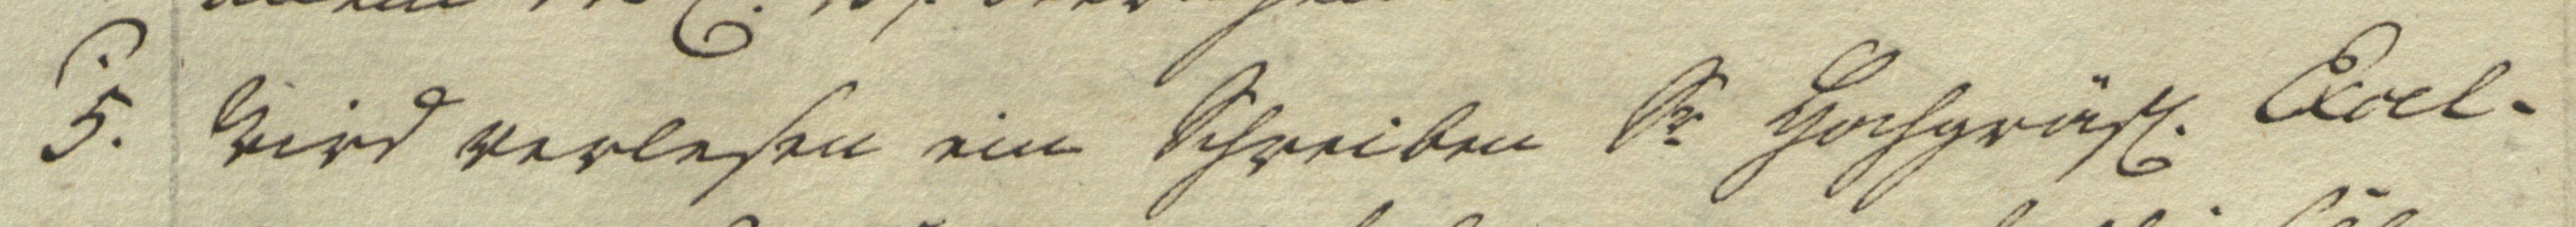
5. Wird verlesen ein Schreiben Sr Hochgräfl. Excel¬
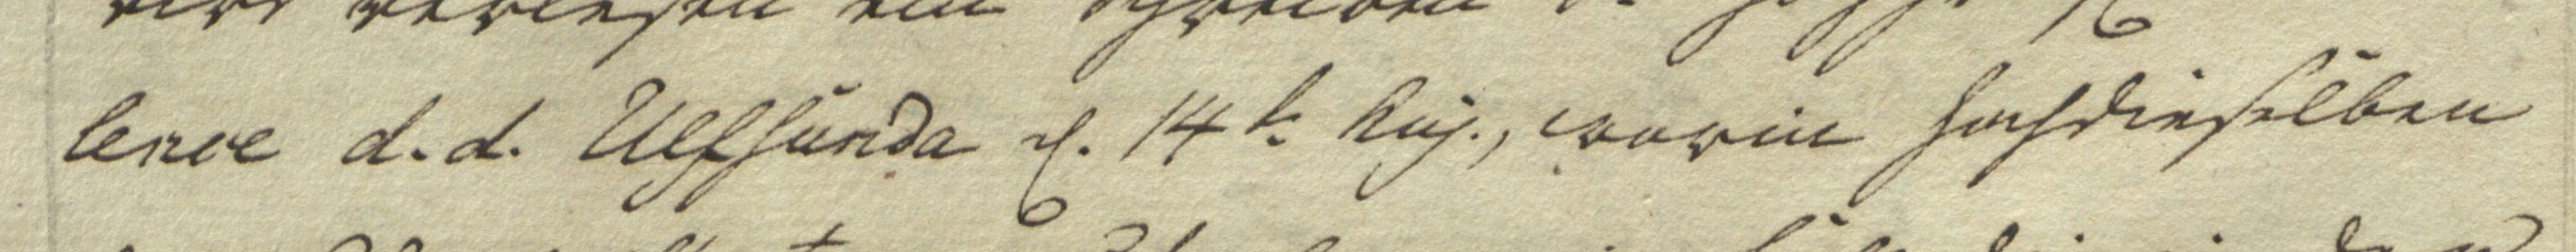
lence d. d. Ulfsunda d. 14 te huj. worin Hochdieselben
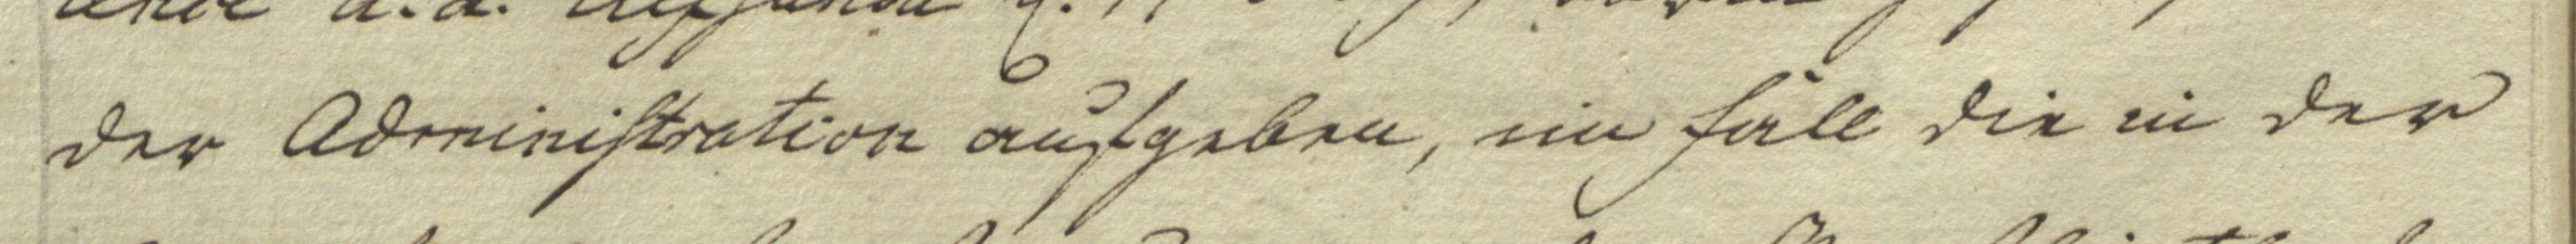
der Administration aufgeben, im Fall die in der
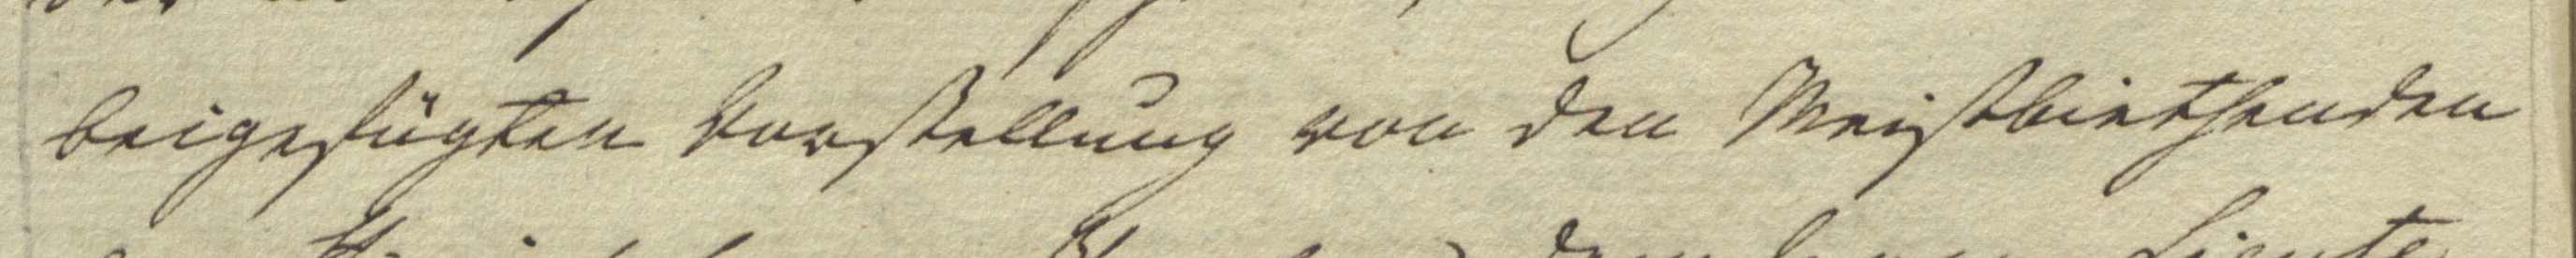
beigefügten Vorstellung von den Meistbiethenden
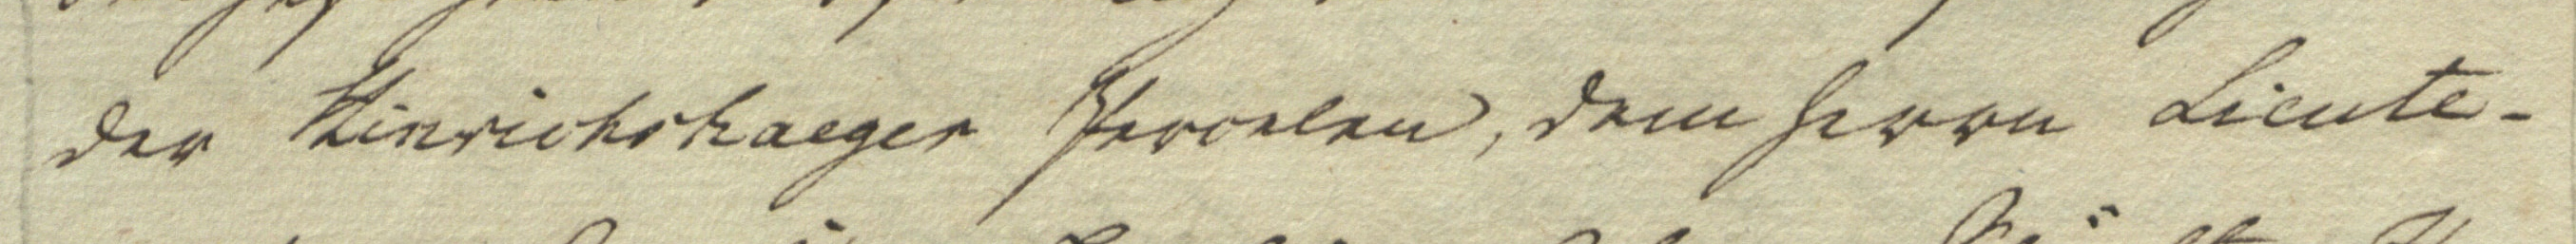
der Hinrichshaeger Percelen, dem Herrn Lieute¬
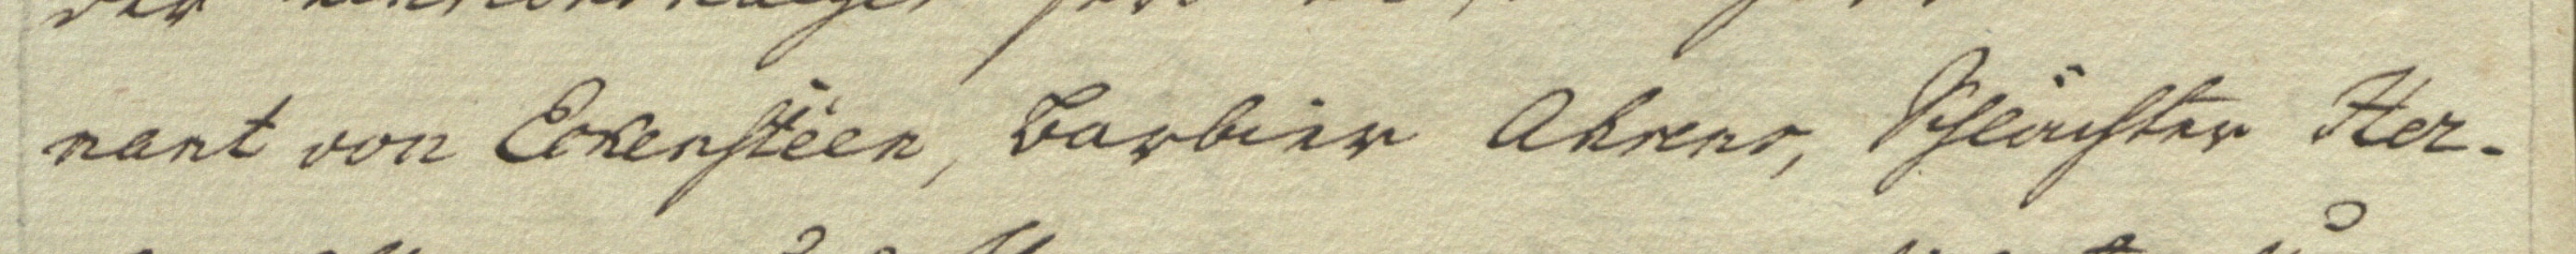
nant von Eckenstéen, Barbier Ahrens, Schlächter Her¬
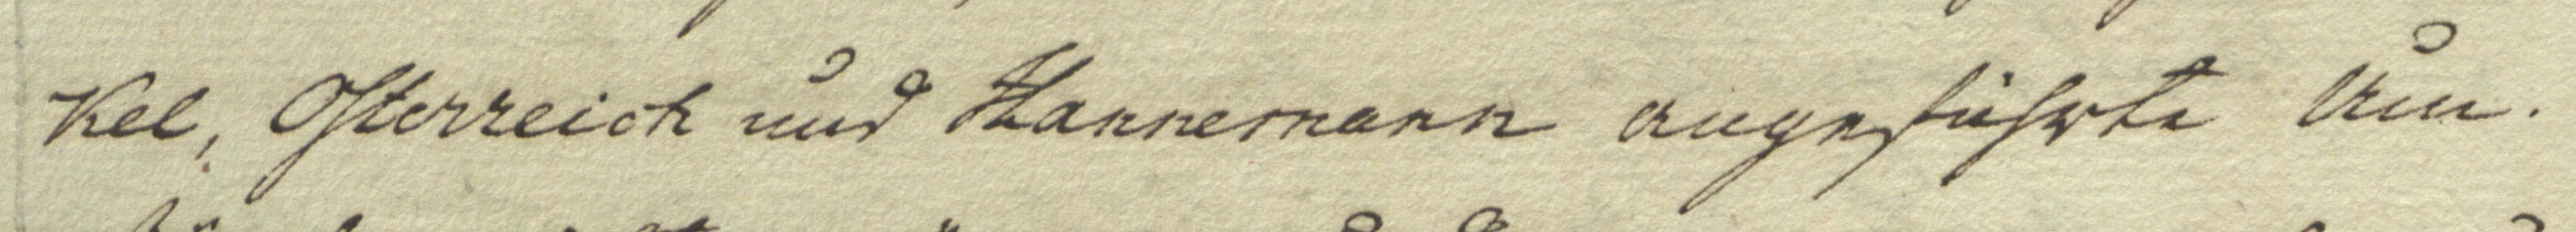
kel, Osterreich und Hannemann angeführte Um¬
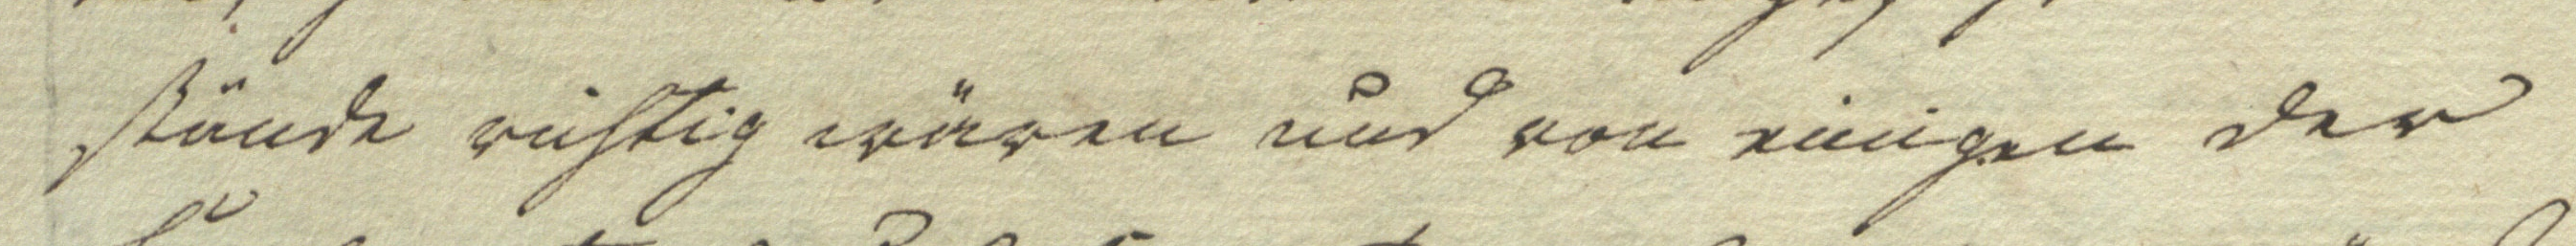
stände richtig wären und von einigen der
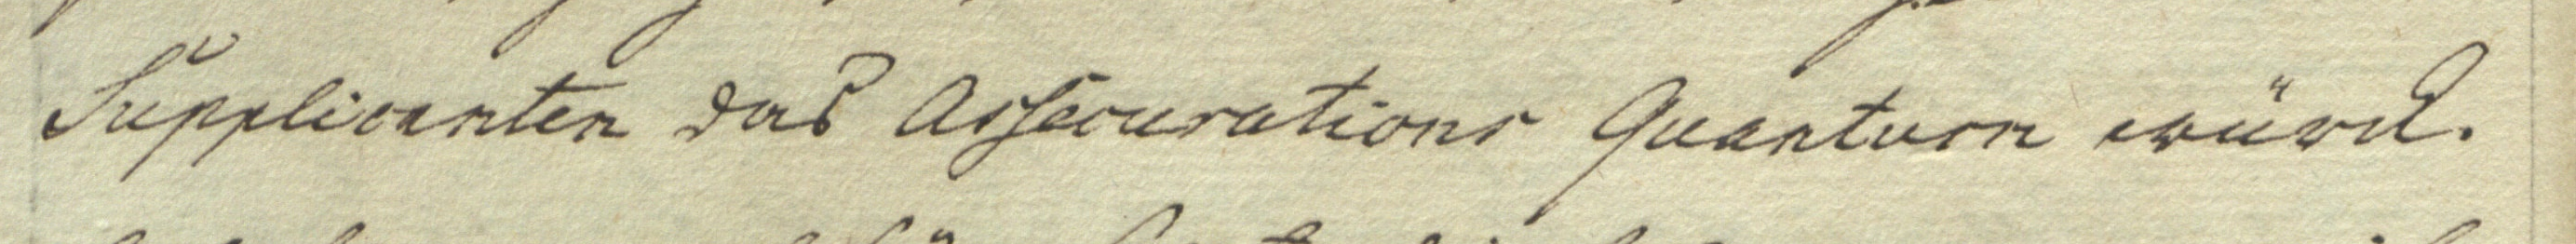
Supplicanten das Assecurations Quantum würck¬
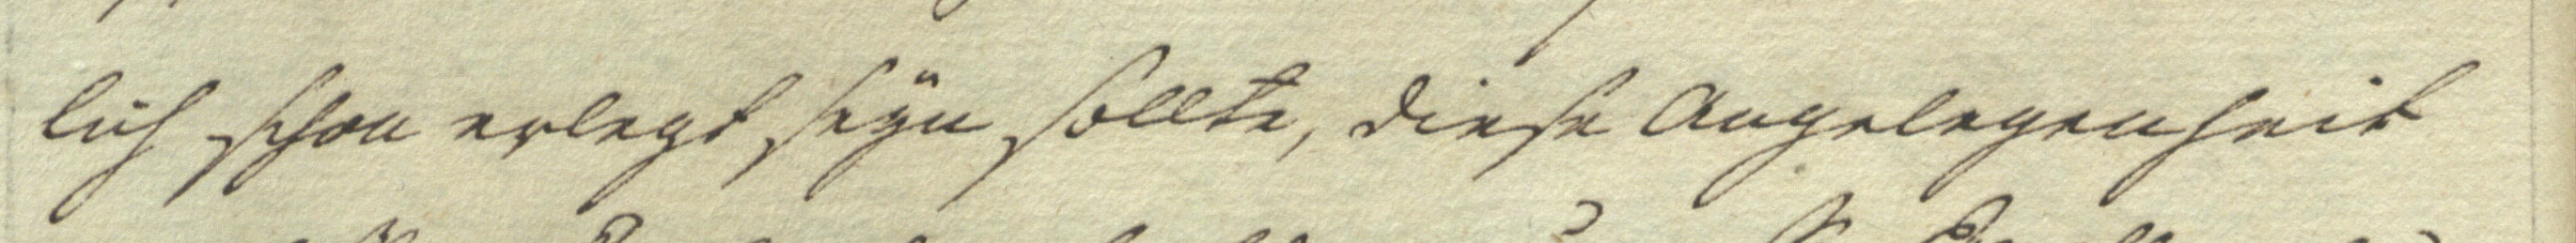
lich schon erlegt seÿn sollte, diese Angelegenheit
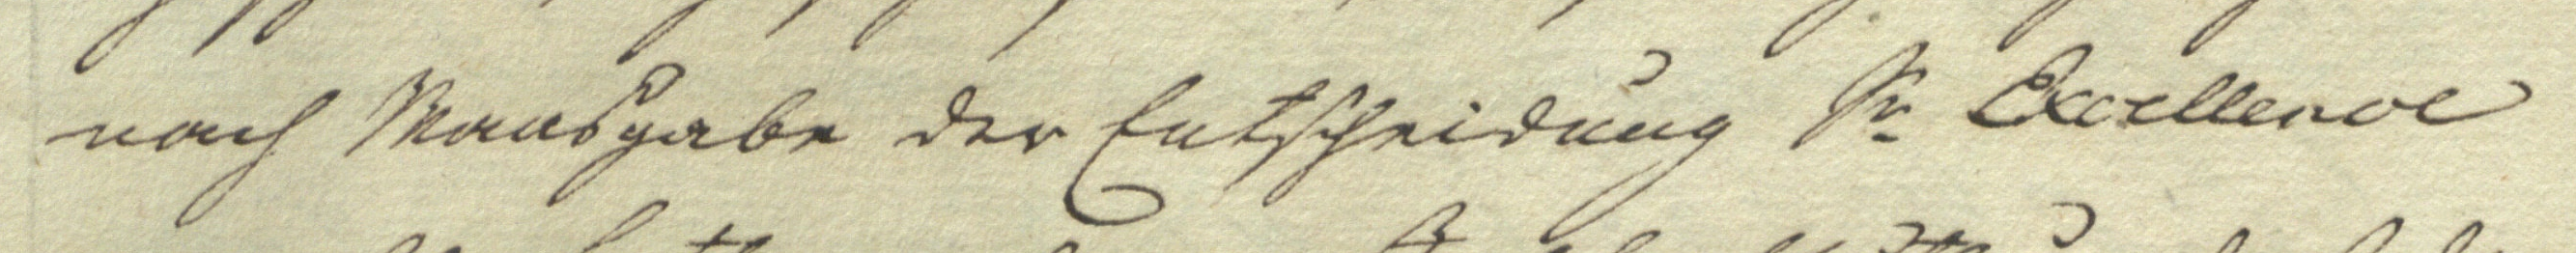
nach Maasgabe der Entscheidung Sr Excellence
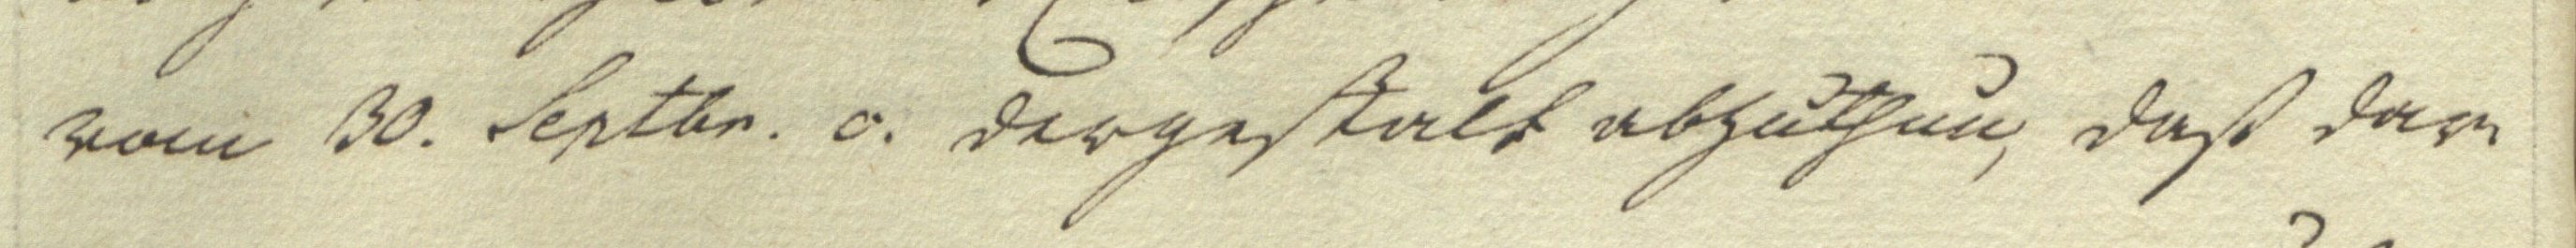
vom 30. Septbr. c. dergestalt abzuthun, daß dar¬
